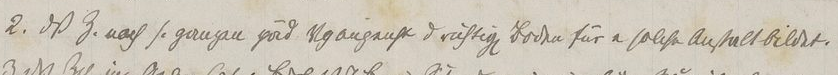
2. dß Z. nach s. ganzen päd Vgangenht d richtigen Boden für e. solche Anstalt bildet.
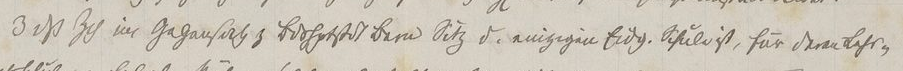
3 dß Zch im Gegensatz z Bdshptstdt Bern Sitz d. einzigen Eidg. Schule ist, für deren Lehr-
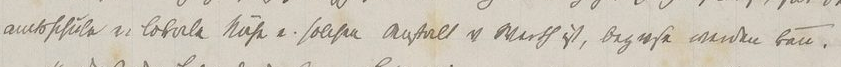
amtsschule e. lokale Nähe e. solchen Anstalt von Werth ist, bezwse werden kann.
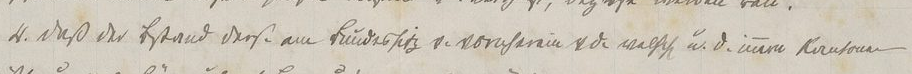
4. daß der Bstand ders. am Bundessitz v. vornherein v. d. welschen u. d. innern Kantonen
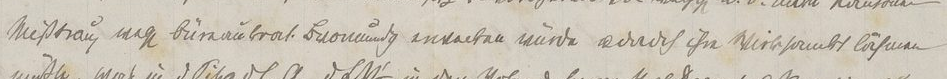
Mißtrauen wegen büreaukrat. Bvormundg erwecken würde u dadch ihre Wirksamkt lähmen
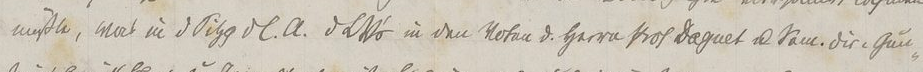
müßte, was in d Sitzg d. C.A. d LV's in den Voten d. Herrn Prof Daguet & Sem.dir. Gun-
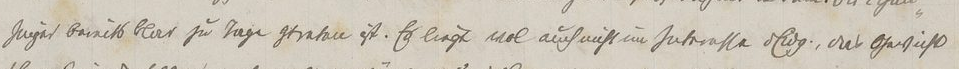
zinger bereits klar zu Tage gtreten ist. Es liegt wol auch nicht im Interesse d Eidg., das Gewicht
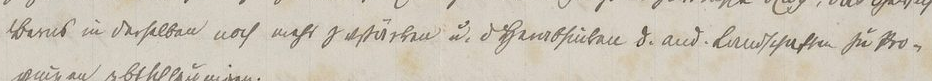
Berns in derselben noch mehr z vstärken u. d Herabsinken d. and. Landschaften zu Pro-
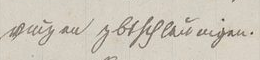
vinzen z beschleunigen.
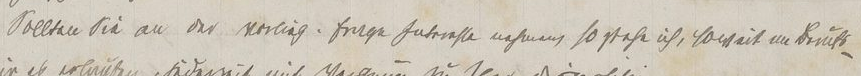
Sollten Sie an der vorlieg. Frage Interesse nehmen, so stehe ich, soweit meine Berufs-
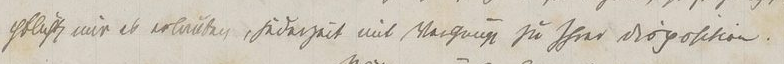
pflichten mir es erlauben, jederzeit mit Vergnügen zu Ihrer Disposition.
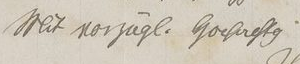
Mit vorzügl. Hochachtg
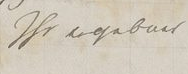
Ihr ergebner
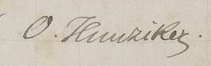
O. Hunziker.
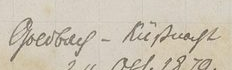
Goldbach-Küßnacht
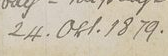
24. Okt. 1879.
